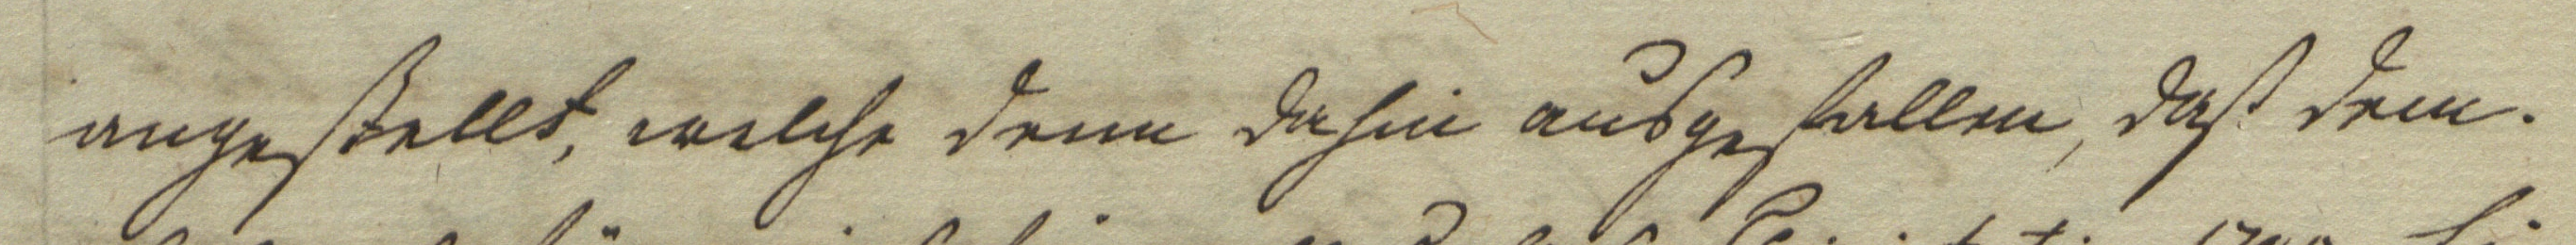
angestellt, welche denn dahin ausgefallen, daß dem¬
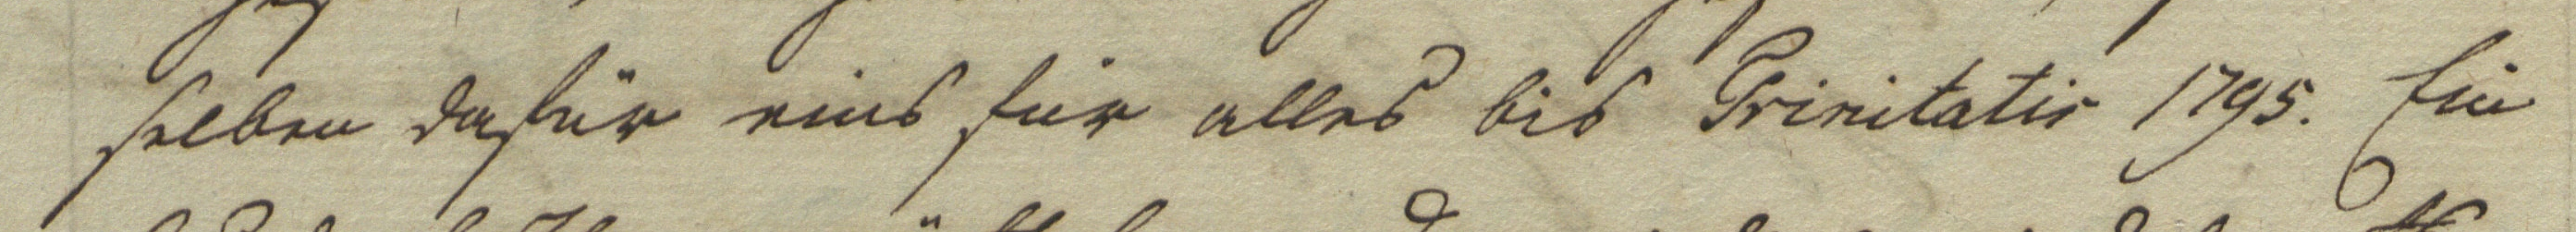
selben dafür eins für alles bis Trinitatis 1795. Ein¬
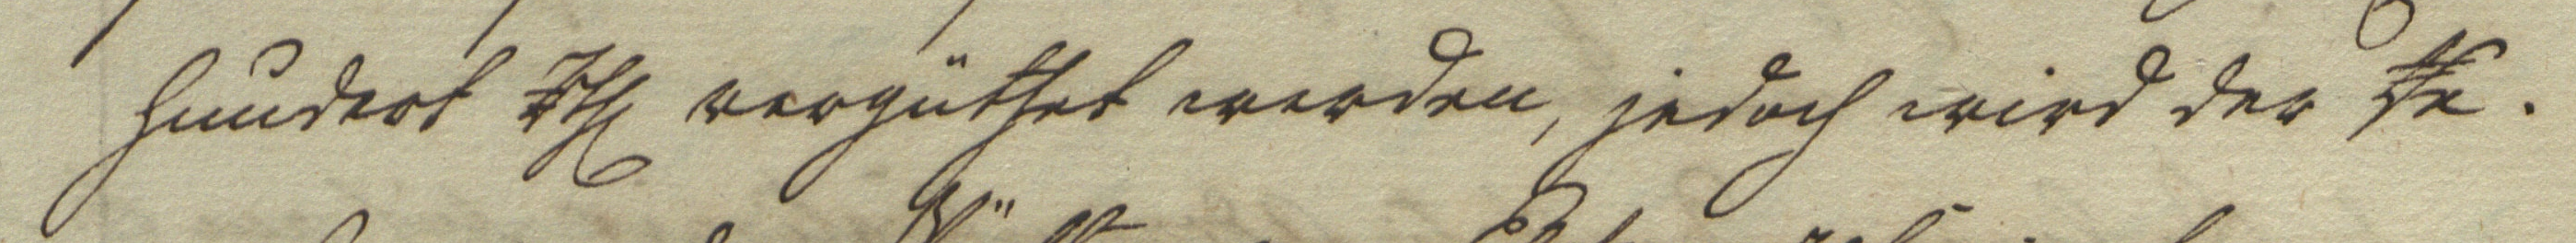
hundert Rthl. vergüthet werden, jedoch wird der Re¬
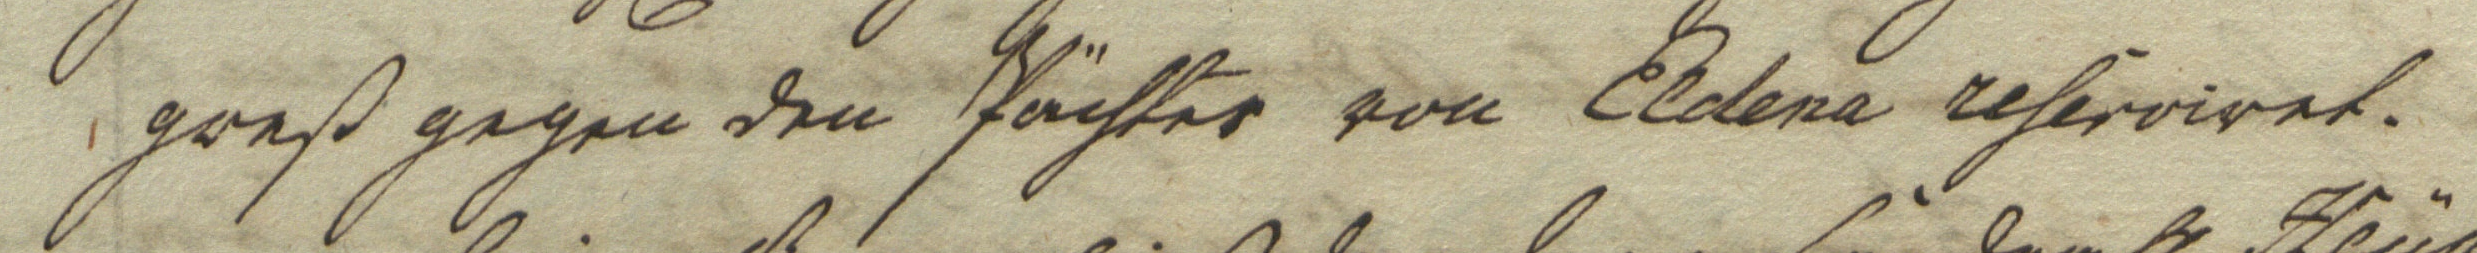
greß gegen den Pächter von Eldena reserviret.
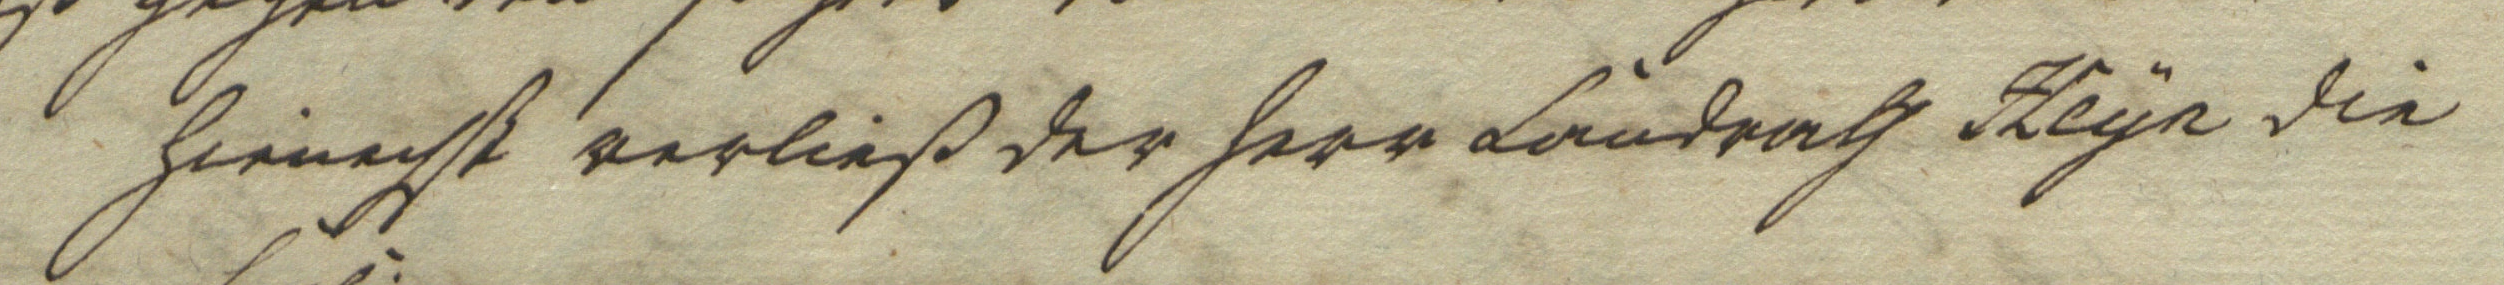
Hienechst verließ der Herr Landrath Heyn die
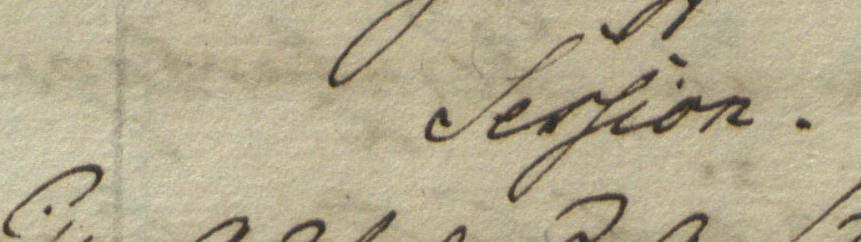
Session.
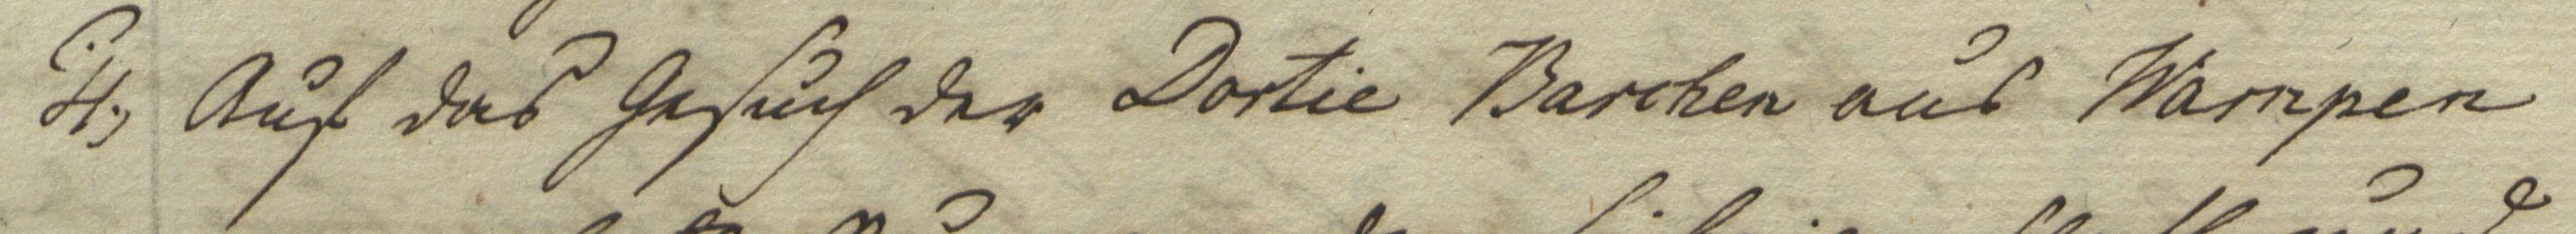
4., Auf das Gesuch der Dortie Barchen aus Wampen
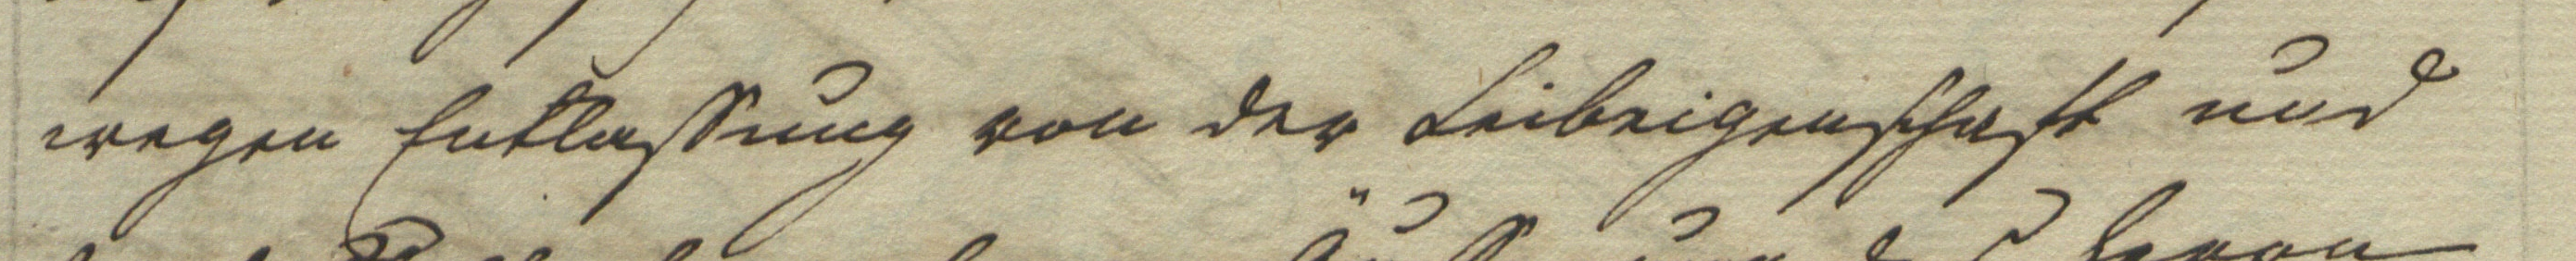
wegen Entlassung von der Leibeigenschaft und
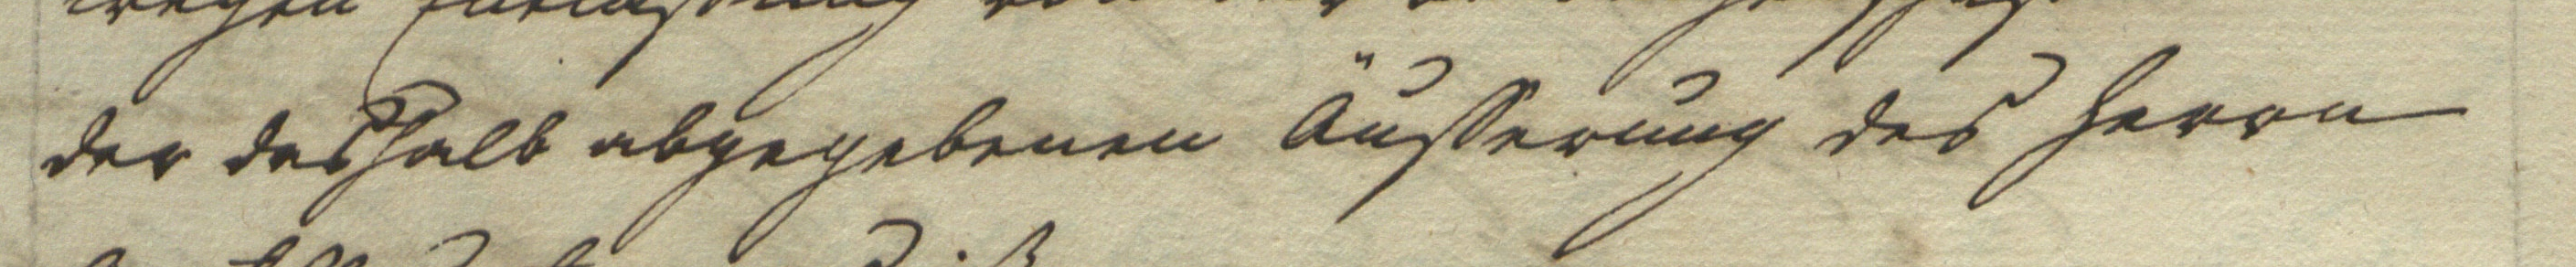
der deshalb abgegebenen Äusserung des Herrn
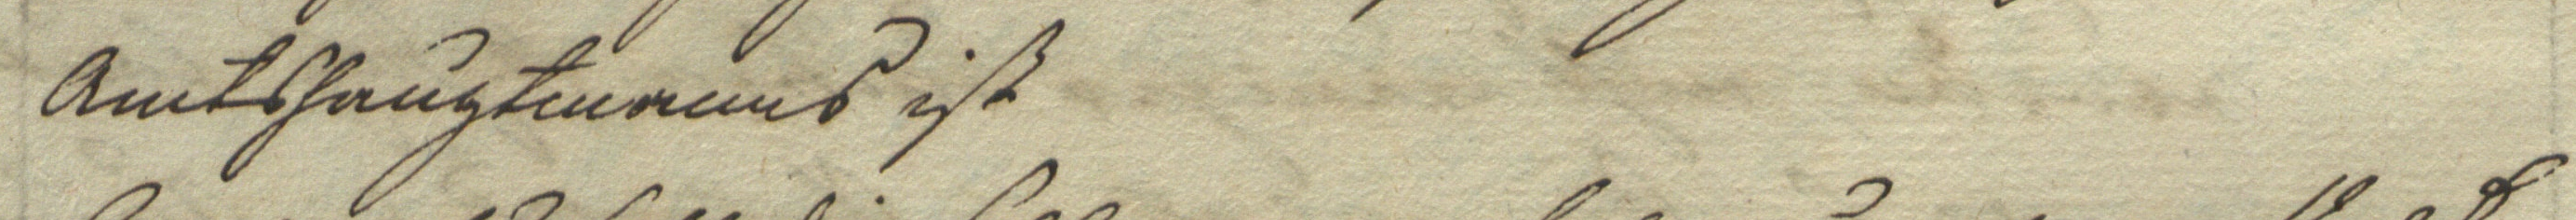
Amtshauptmanns ist
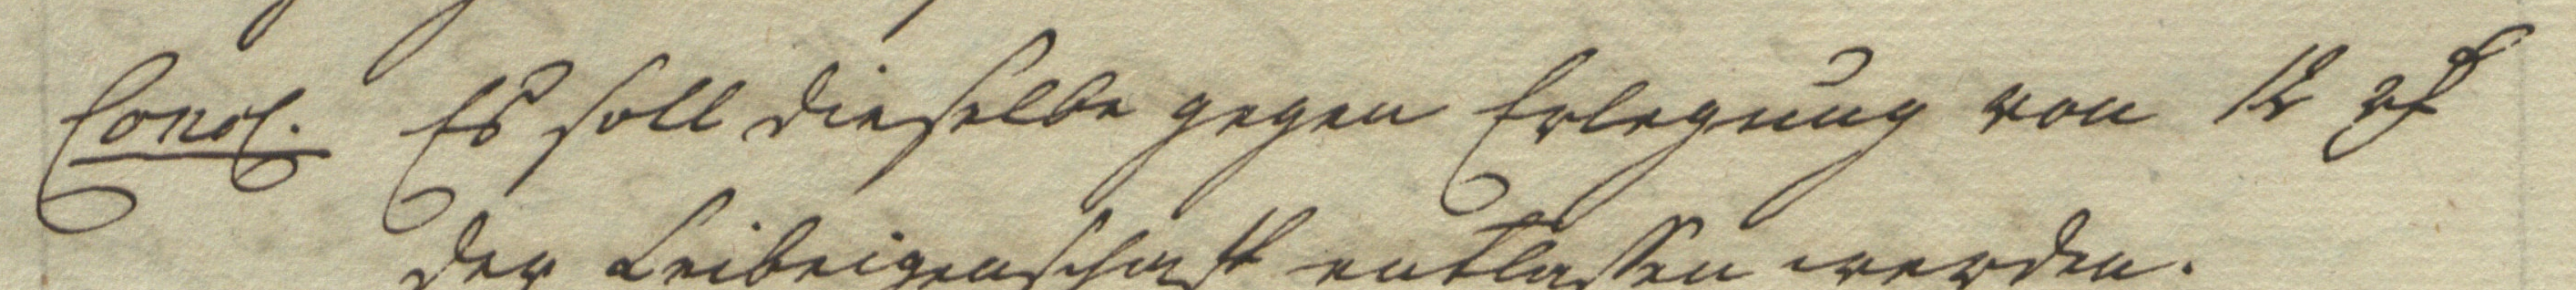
Concl. Es soll dieselbe gegen Erlegung von 12 rtl.
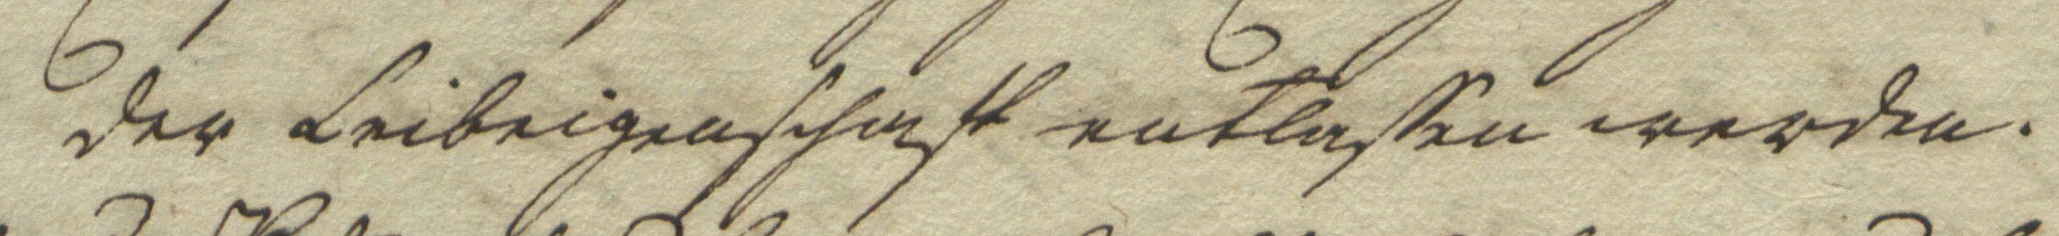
der Leibeigenschaft entlassen werden.
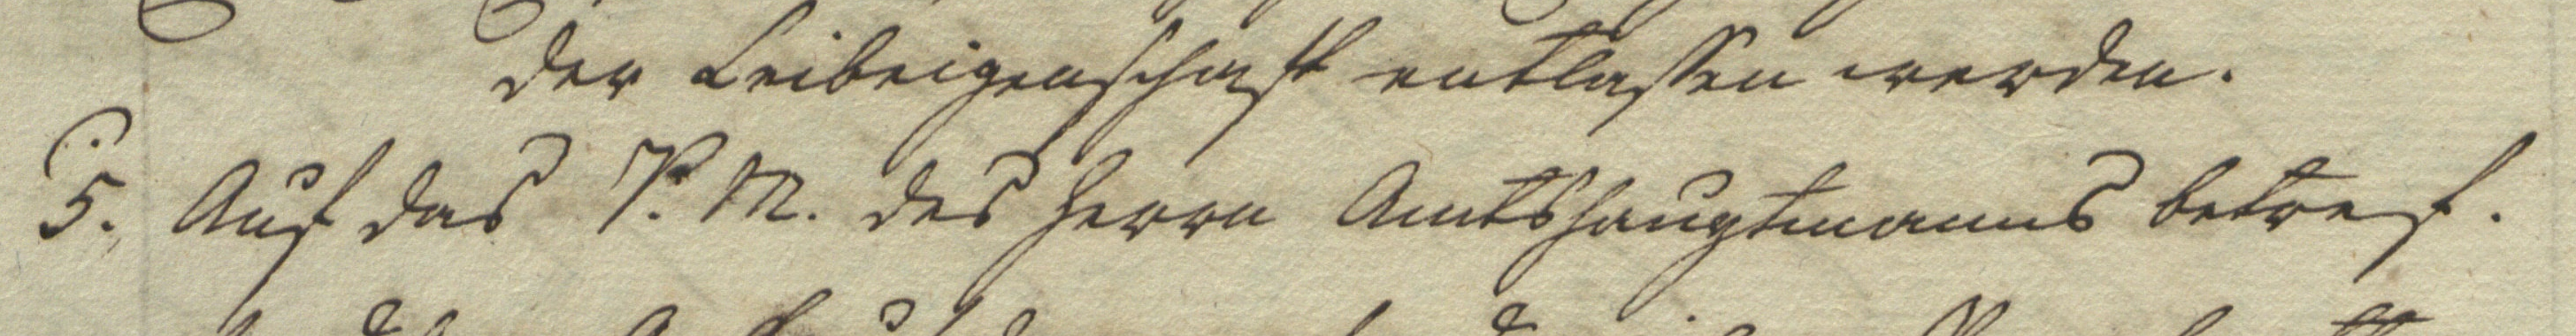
5. Auf das P. M. des Herrn Amtshauptmanns betref¬
